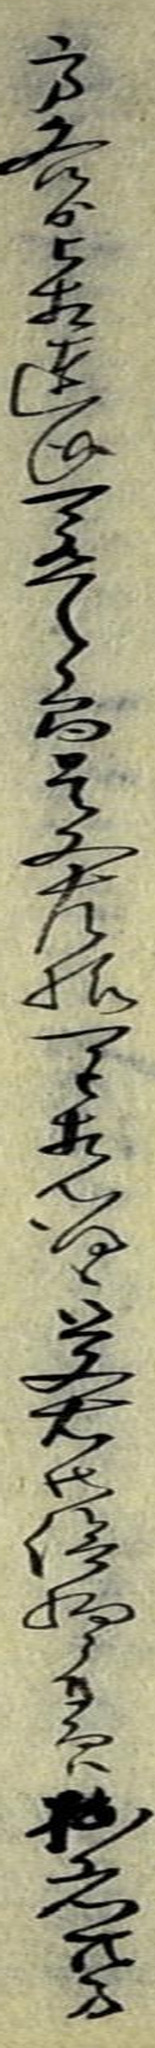方各ゟ被相達趣可有之候間是又左様可被相心得候且又右御倹約に付而は拙者共方
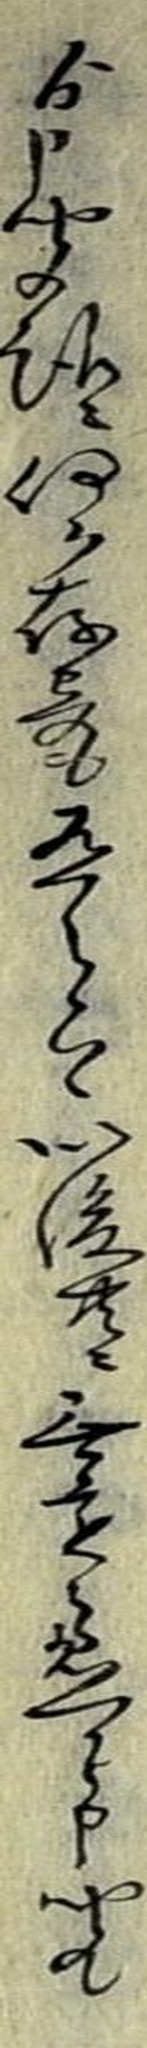ゟ申聞趣に何か存寄も有之候はゝ以後共に無遠慮可被申聞候
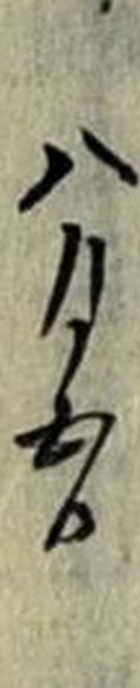八月五日
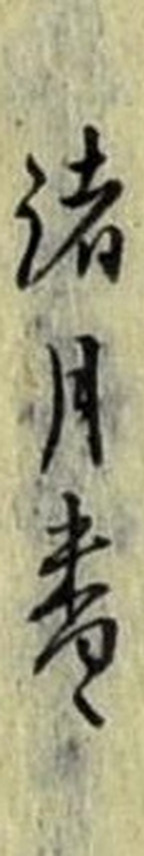諸月番へ
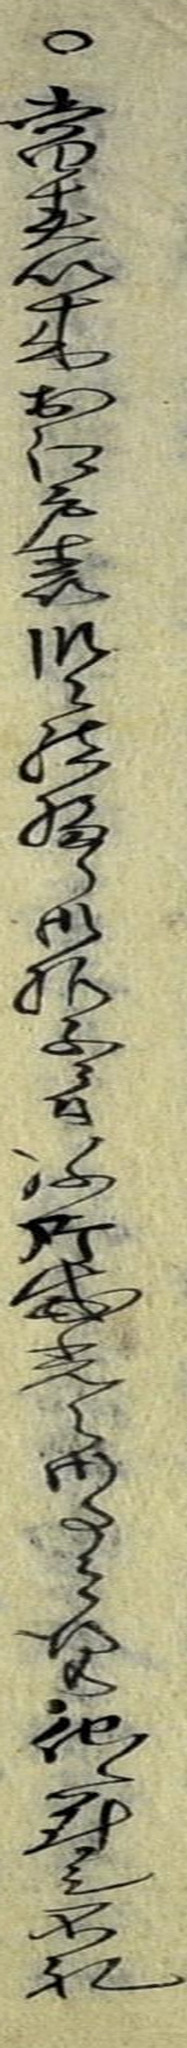〇当春以来於江戸表段々結構之御様子に付弥御威光之御事に候得共他へ対し不礼
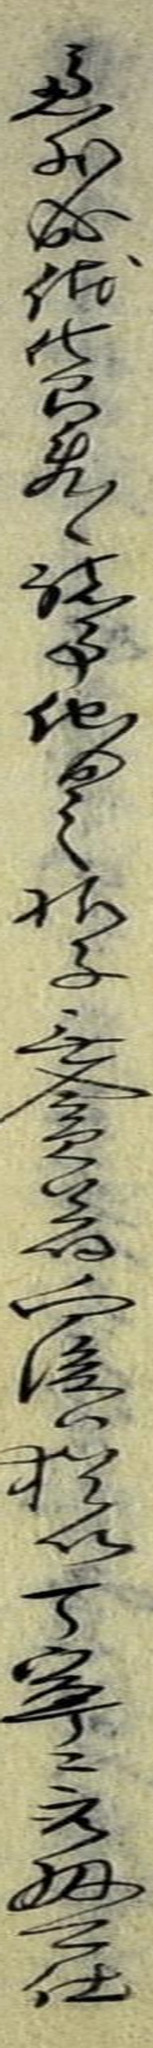慮外成体仕間敷候諸事他ゟ之様子無貪着向後は猶以丁寧に取扱可仕
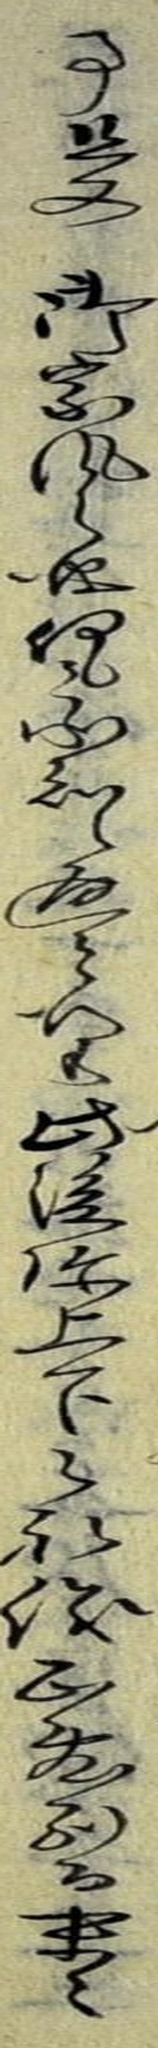事且又御家風之儀何も承知之通に候得共此後弥上下之礼儀正敷別而末々
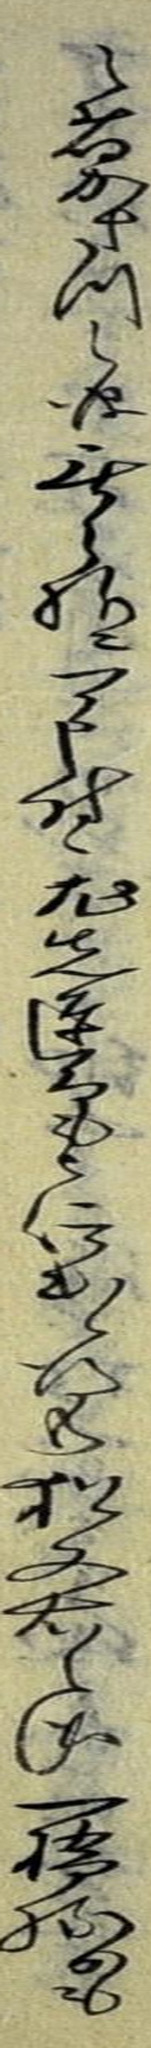之者かさつ之儀無之様に可申付候尤先達而も被仰出候得共猶又右之趣一橋様ゟも
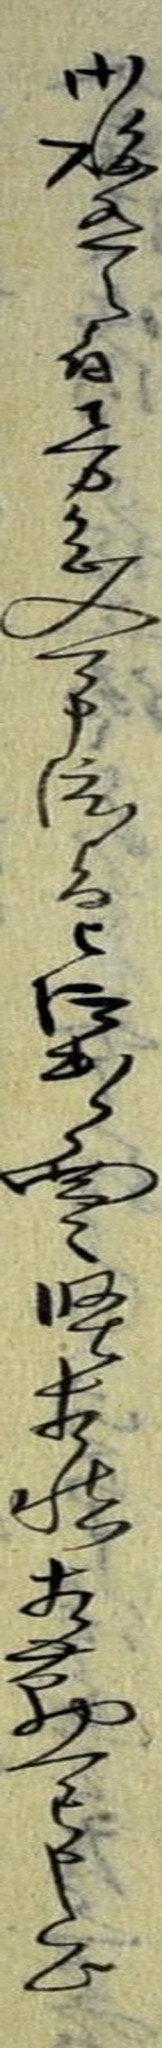御帰有之に付旁念入可申渡旨被仰出候面々堅相慎相勤可被申以上
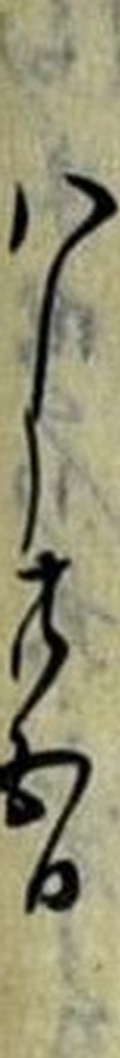八月廿五日
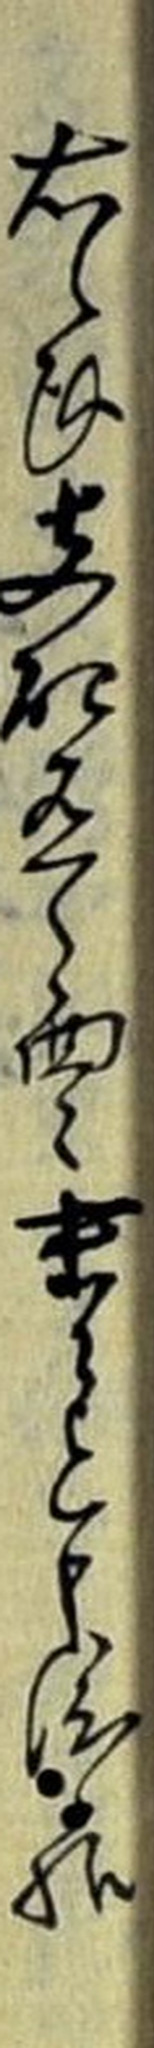右之趣支配有之面々末々迄申渡様
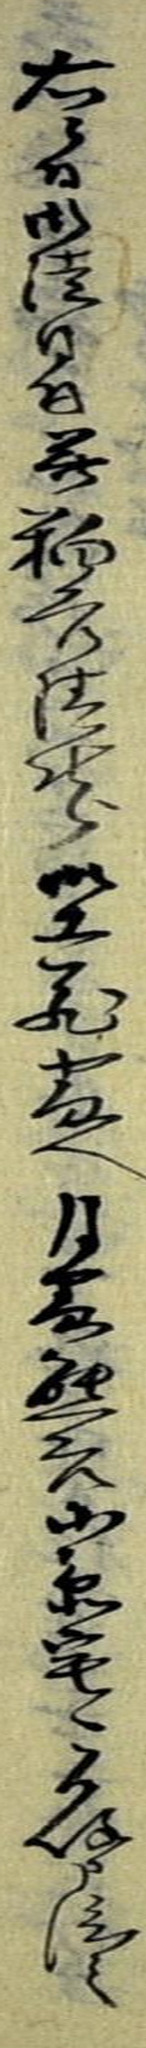右に付御徒目付并粕谷清次郎御土蔵番人月番熊谷小兵衛宅へ召呼申渡之
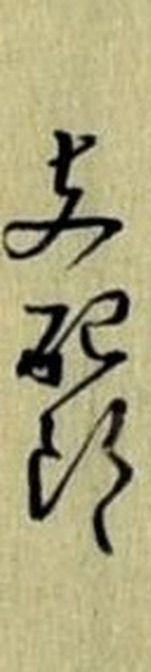支配頭へ
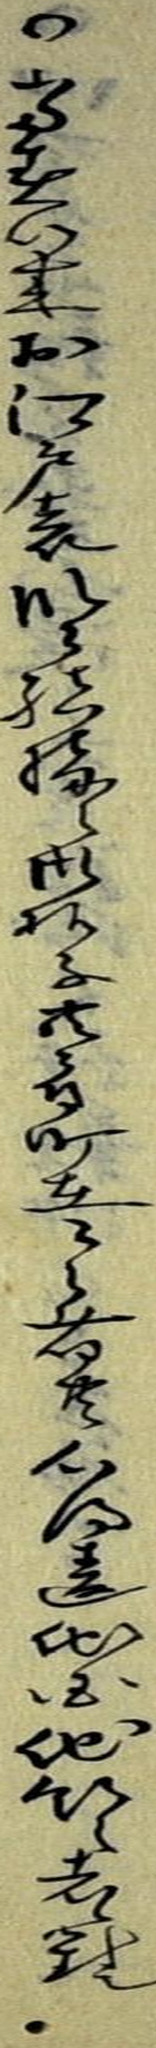〇当春以来於江戸表段々結構之御様子共に付町在々之者共心得違他国他領之者に対し
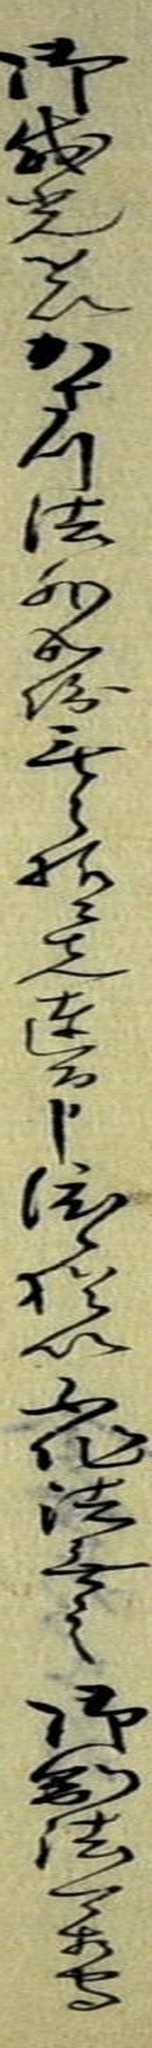御威光を以かさつ法外成儀無之様に先達而申渡候猶以不作法無之御制法可相守
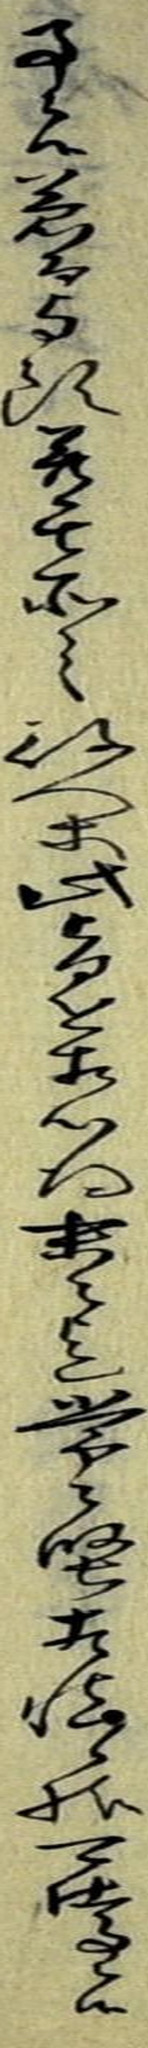事に候兼而与頭并其所之役人等此旨を相心得末々迄常に堅相慎候様可仕事に候
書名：命令之部 二
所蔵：福井県文書館 Fukui Prefectural Archives
